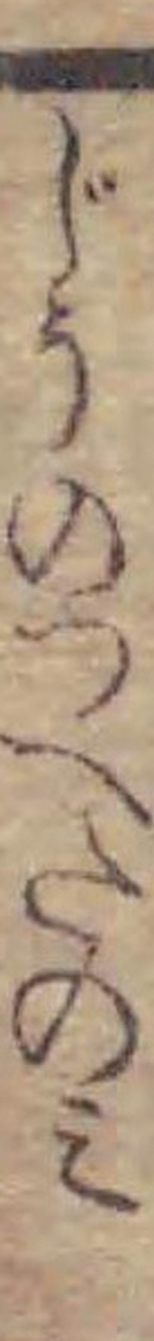じうのつへたのみ
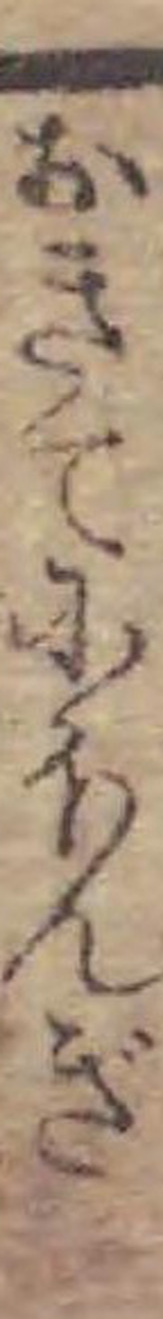おきてにほんぎ
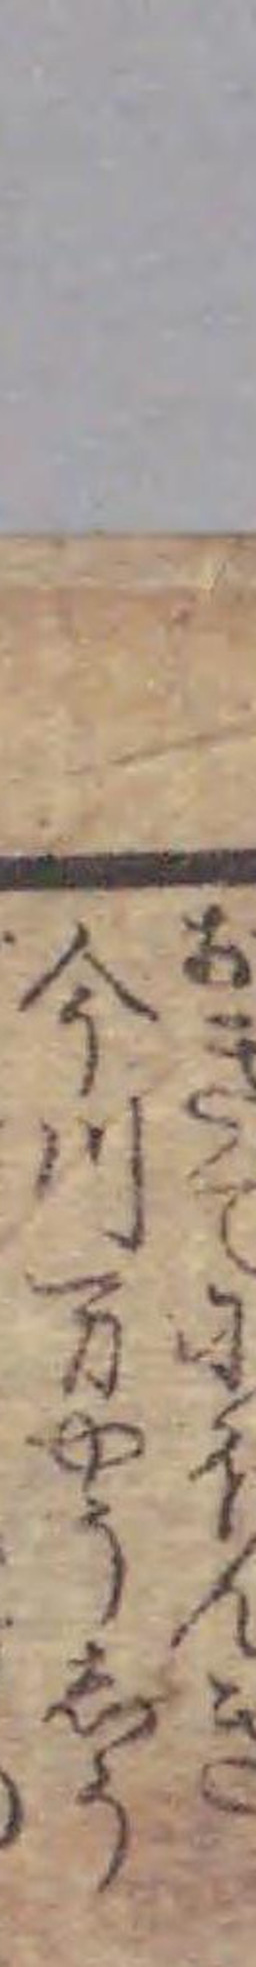今川万やうしう
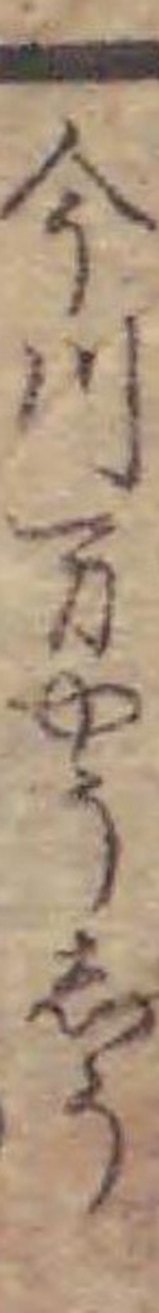今川万やうしう
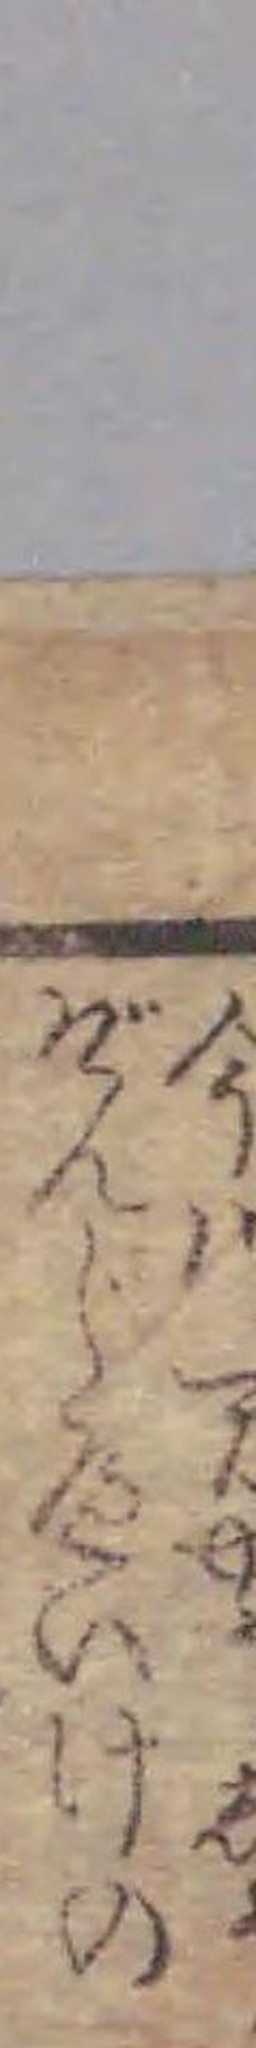げんじへいけの
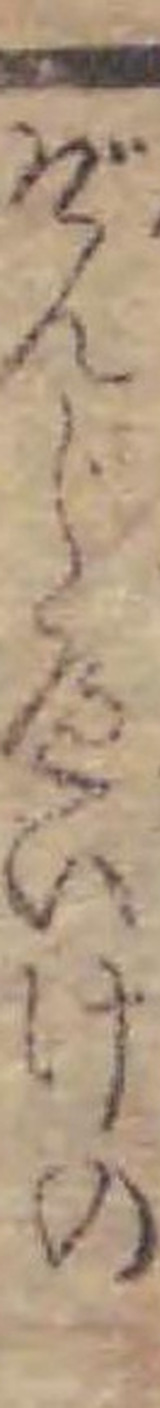げんじへいけの
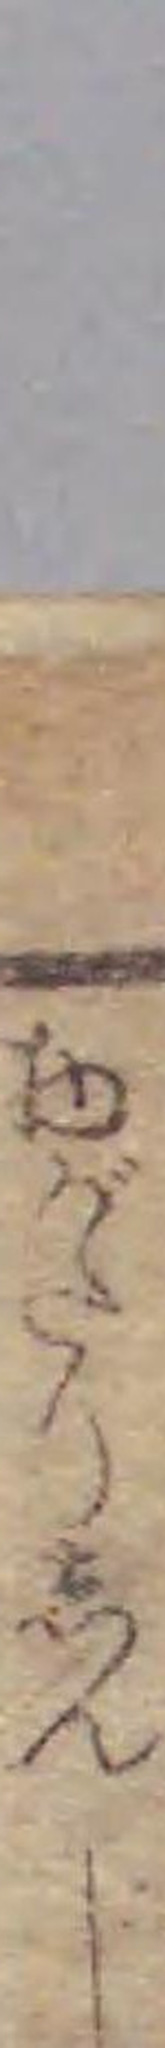物がたりしん
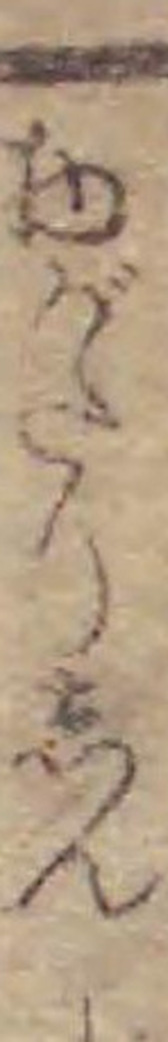物がたりしん
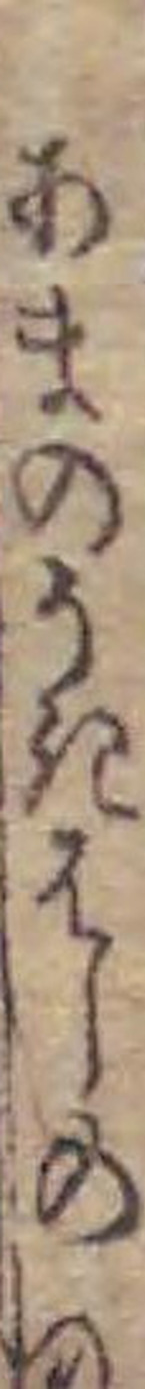あまのうきはしの
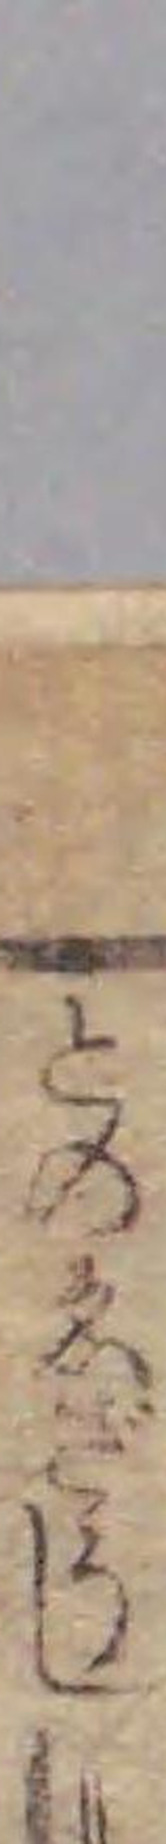このゑざうし
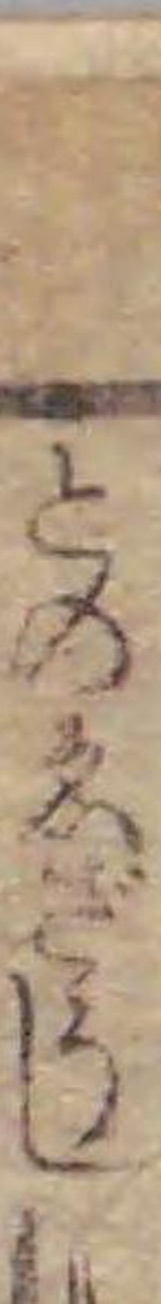このゑざうし
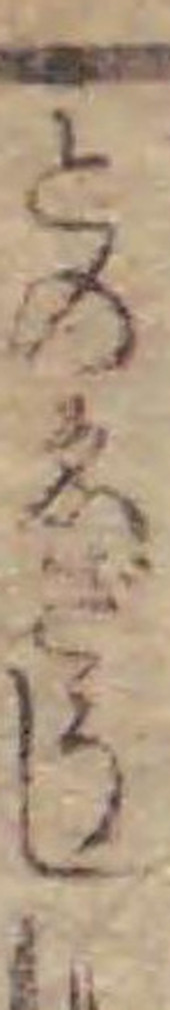このゑざうし
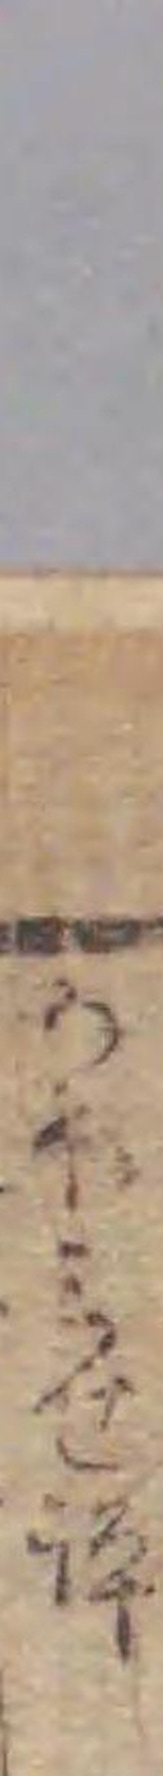かほみせ評
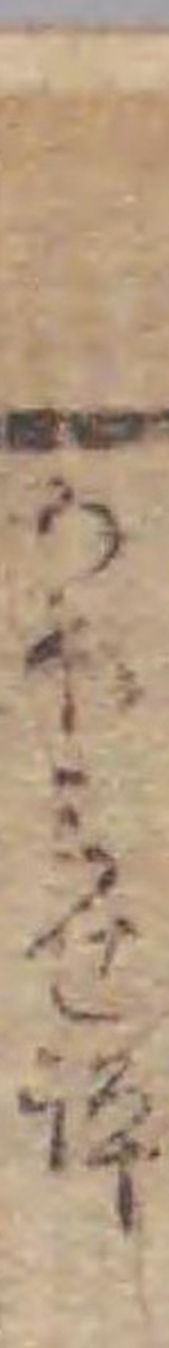かほみせ評
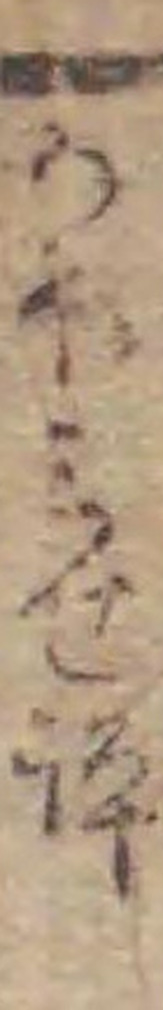かほみせ評
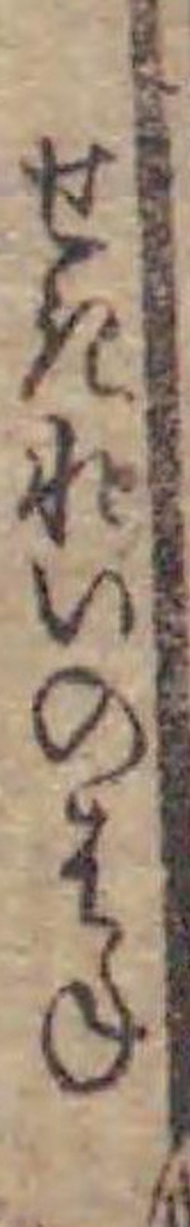せきれいのはね
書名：此奴和日本 : 2巻
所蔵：国立国会図書館 National Diet Library, JAPAN
